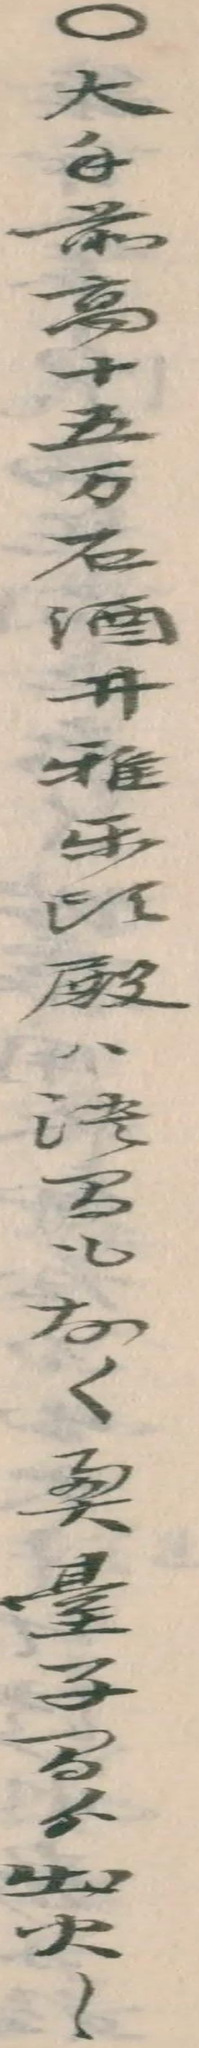〇大手前高十五万石酒井雅楽頭殿は潰間もなく奥台子間ゟ出火し
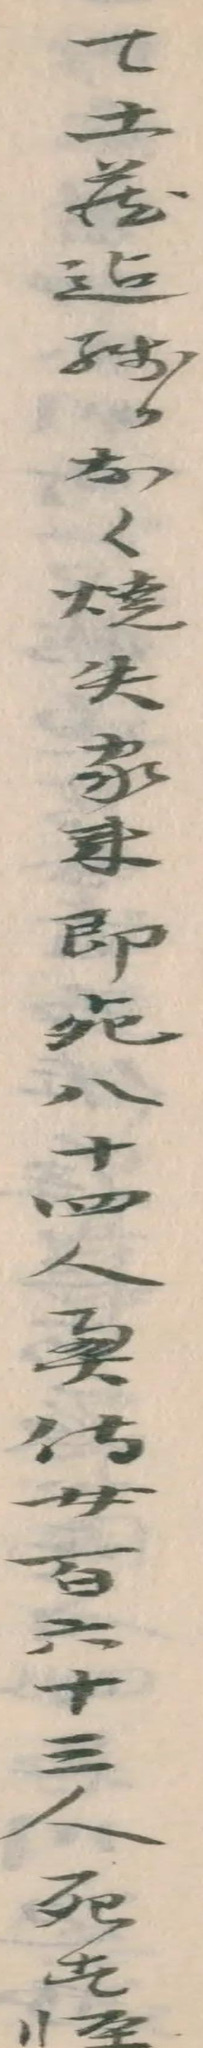て土蔵迄残りなく焼失家来即死八十四人奥侍女百六十三人死す怪
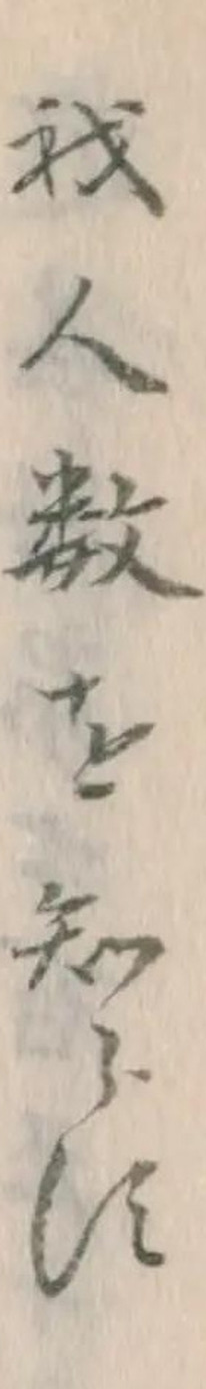我人数を知らす
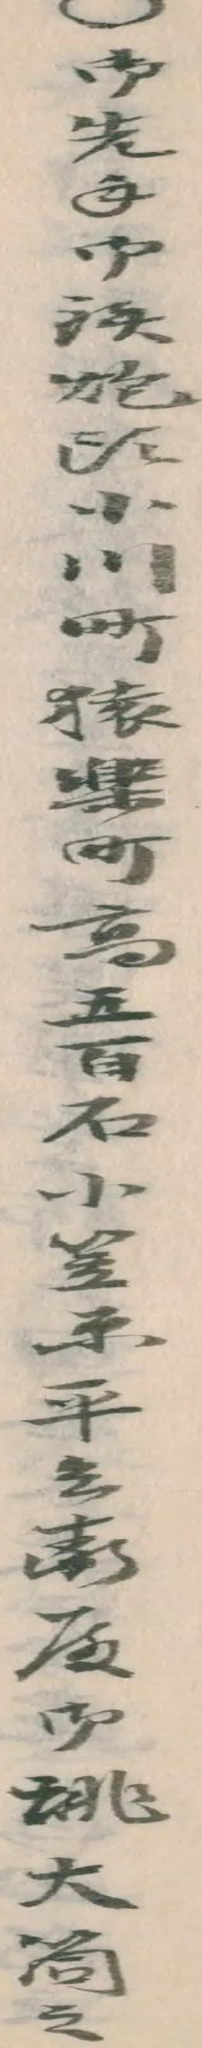〇御先年御鉄炮頭小川町猿楽町高五百石小笠原平兵衛殿御誂大筒之
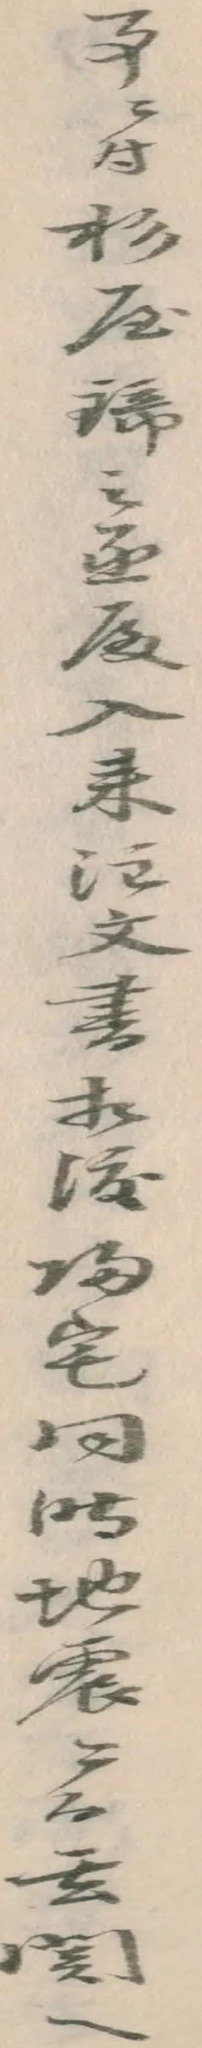事付杉屋錦之丞殿入来注文書相渡帰宅同時地震にて玄関へ
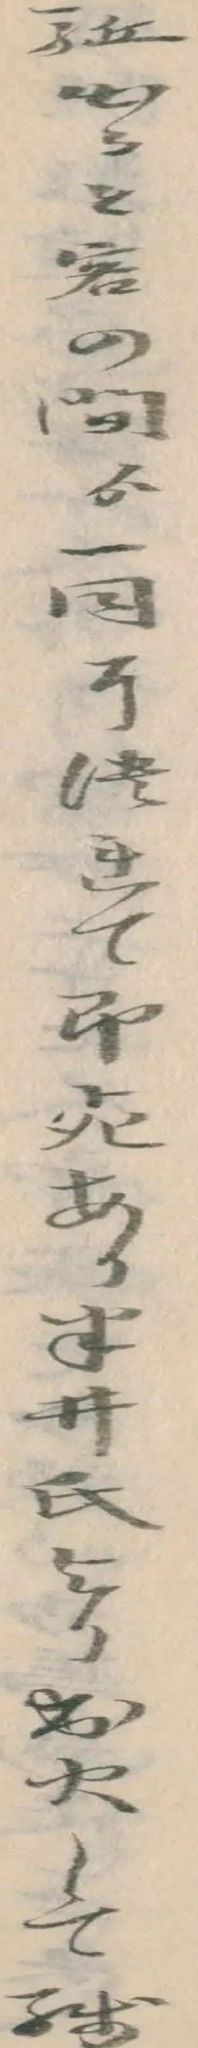駈出ると客の間ゟ一同に潰れて即死あり半井氏より出火して残

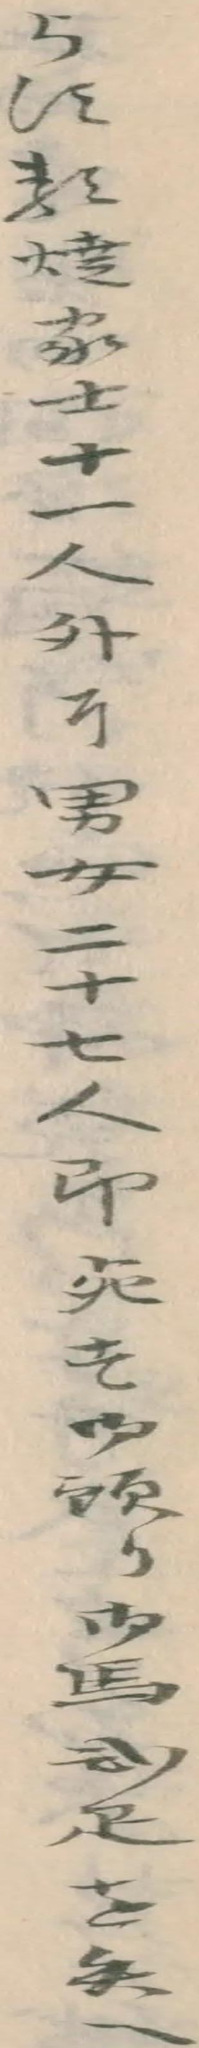らす類焼家士十一人外に男女二十七人即死す御預り御馬弐疋を失へ
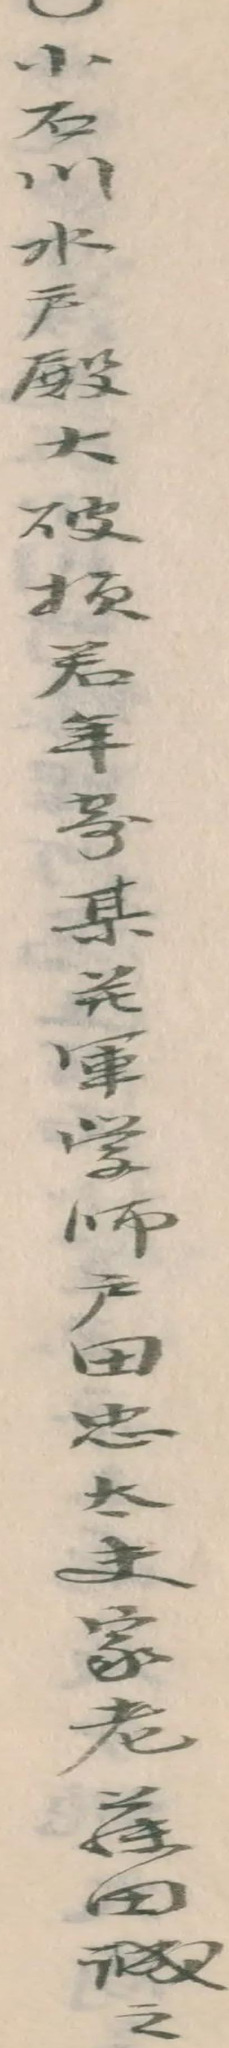〇小石川水戸殿大破損若年寄某并軍学師戸田忠太夫家老藤田誠之
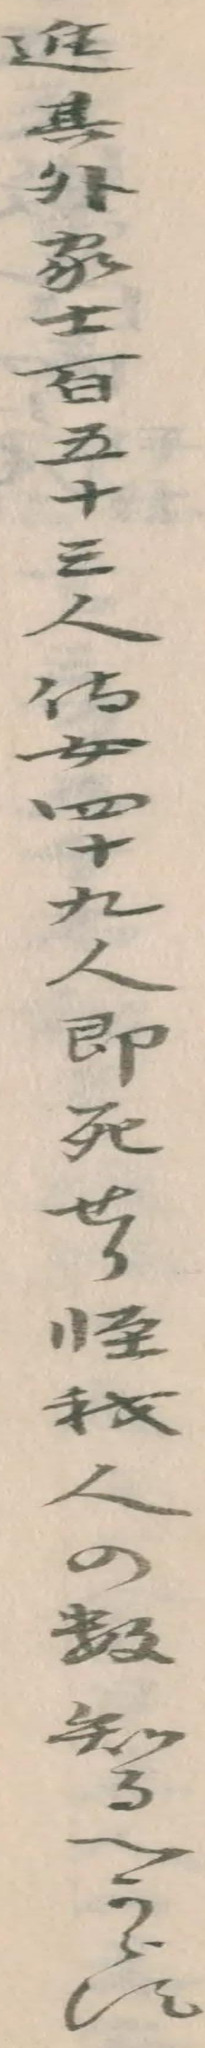進其外家士百五十三人侍女四十九人即死せり怪我人の数知るへからす
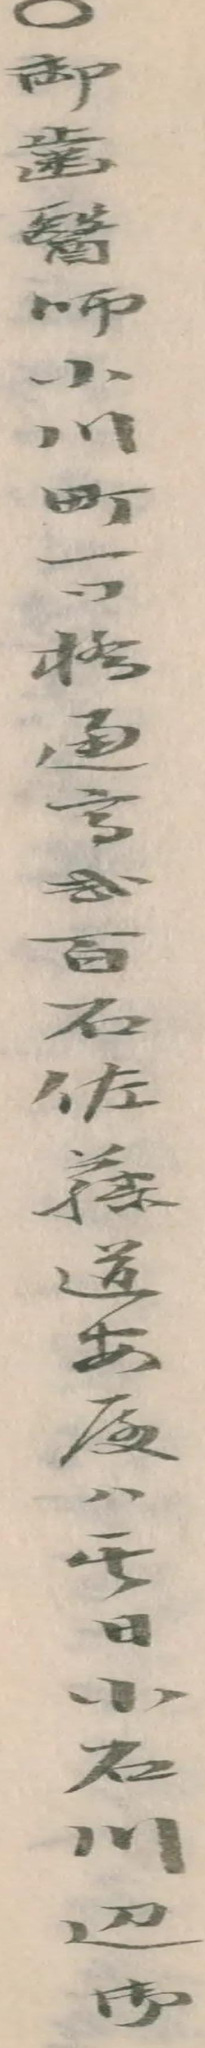〇御歯医師小川町一ツ橋通高弐百石佐藤道安殿は其日小石川辺御
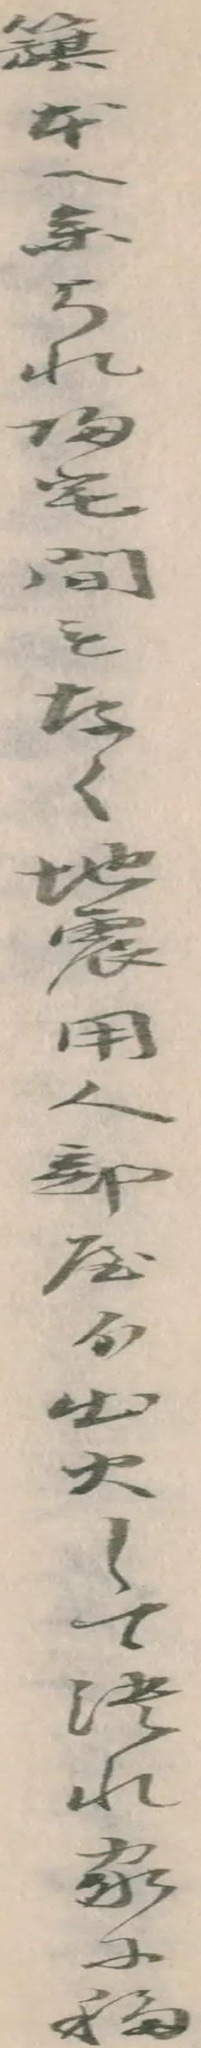籏本へ参られ帰宅間もなく地震用人部屋ゟ出火して潰れ家に移
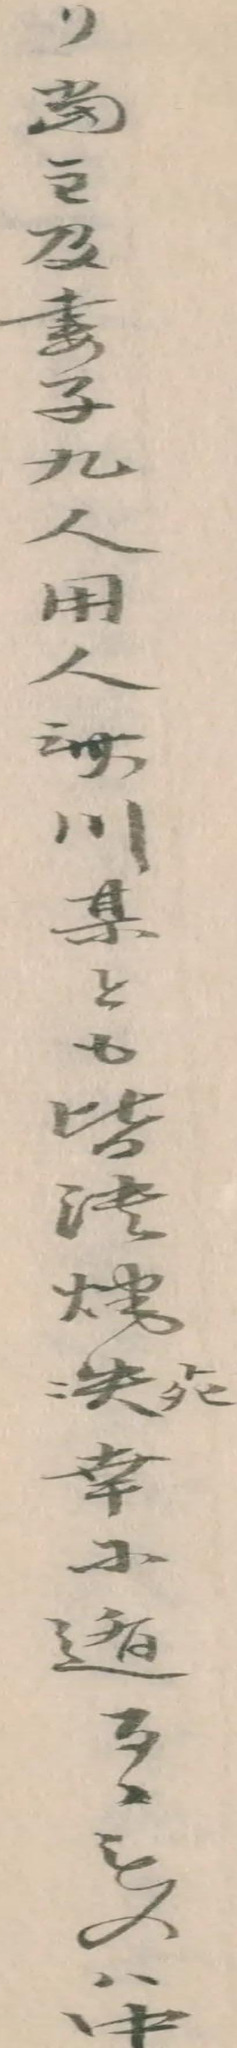り当主及妻子九人用人斉川某とも皆潰焼失幸に遁るゝものは中
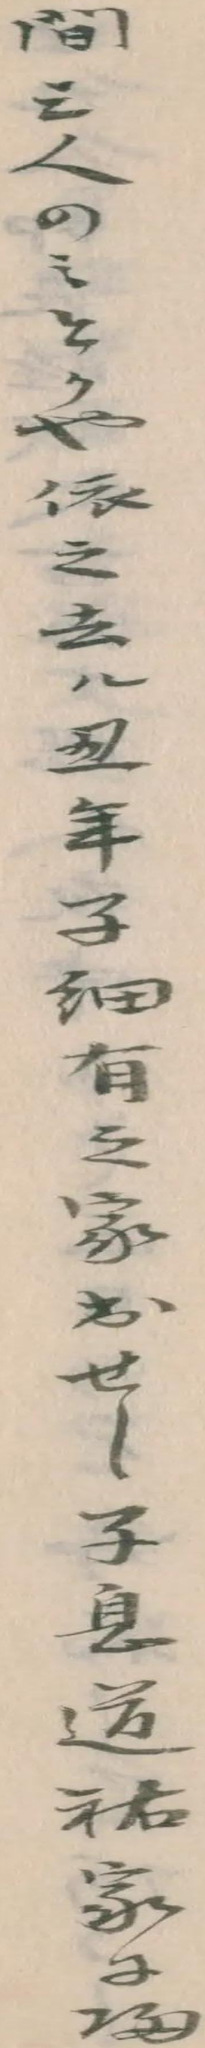間三人のみとかや依之去る丑年子細有之家出せし子息道祐家に帰
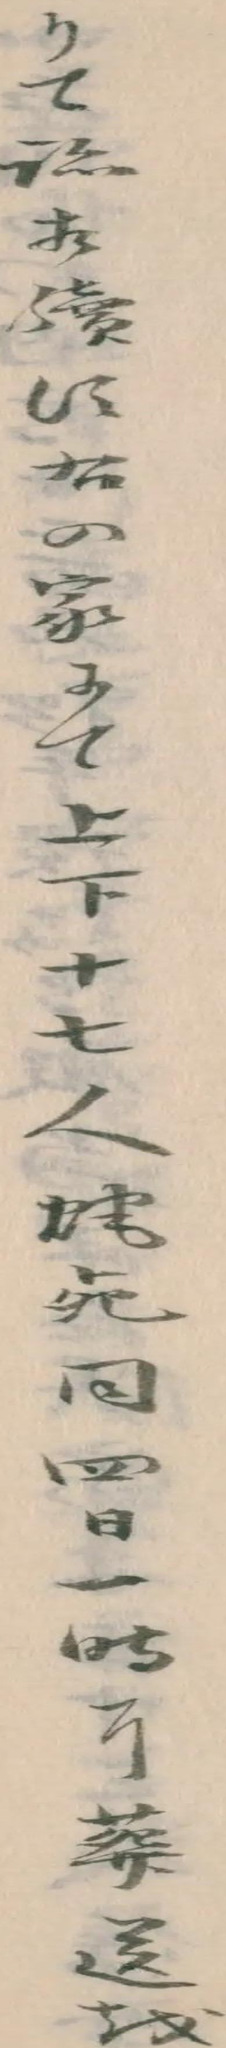りて跡相続す右の家にて上下十七人焼死同四日一時に葬送を
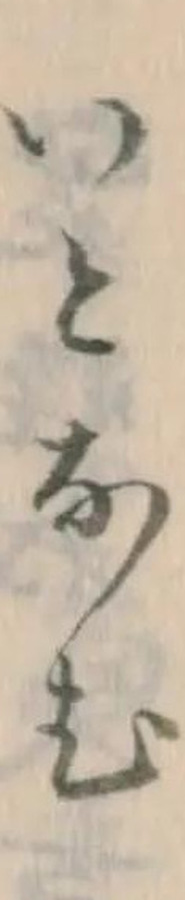いとなむ
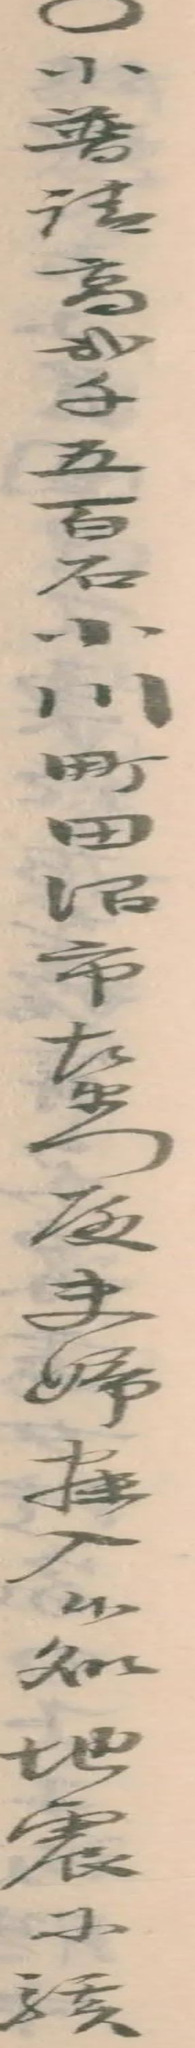〇小普請高弐千五百石小川町田沼市左衛門殿夫婦寝入候処地震に駭
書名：地災撮要. 巻10(地震之部) 上,下
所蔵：国立国会図書館 National Diet Library, JAPAN
